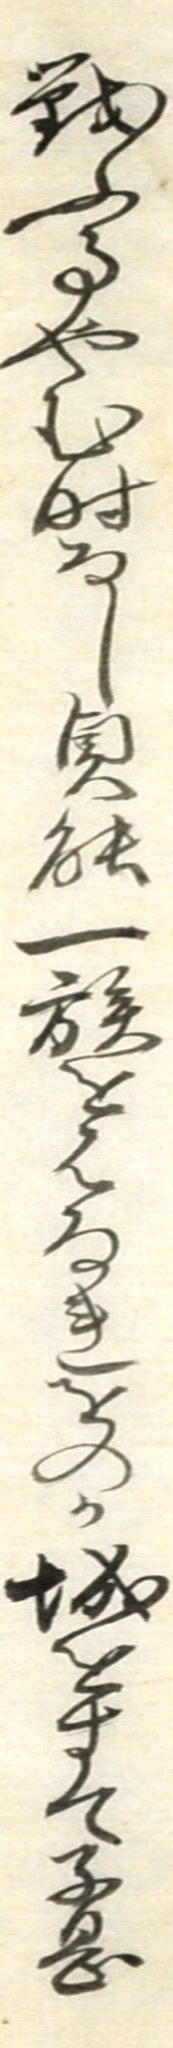戦ふ事やむ時なし貞能一族をはなれをのか城をすて子息
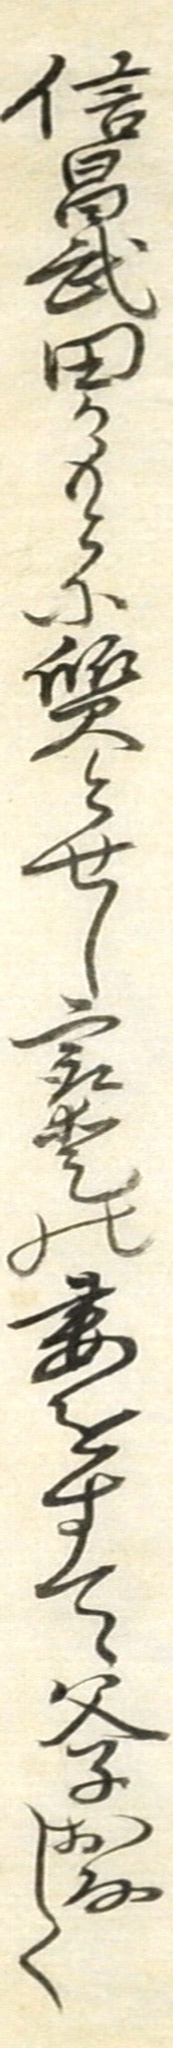信昌武田かもとに質とせし最愛の妻をすてゝ父子おなしく
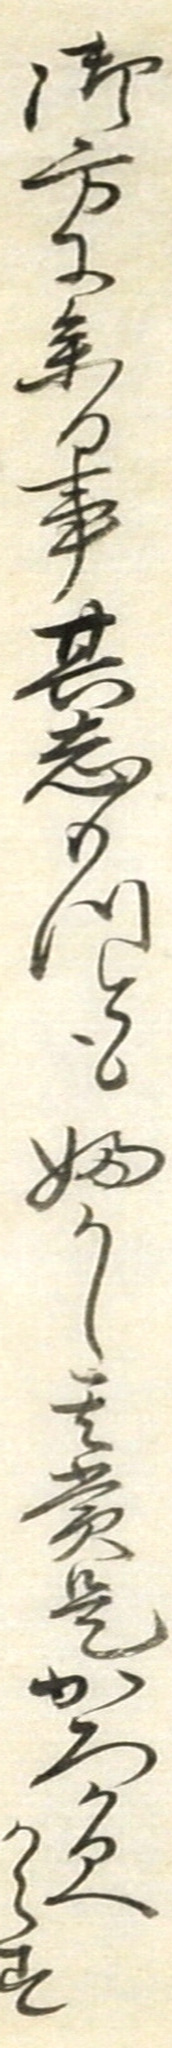御方に参る事其志もつともふかし其賞是かろかるへからす

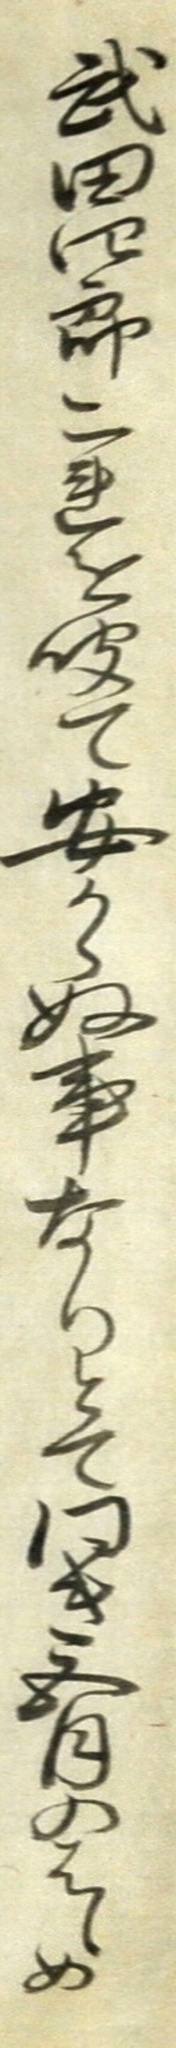武田四郎これを聞て安からぬ事なりとて同き五月のはしめ
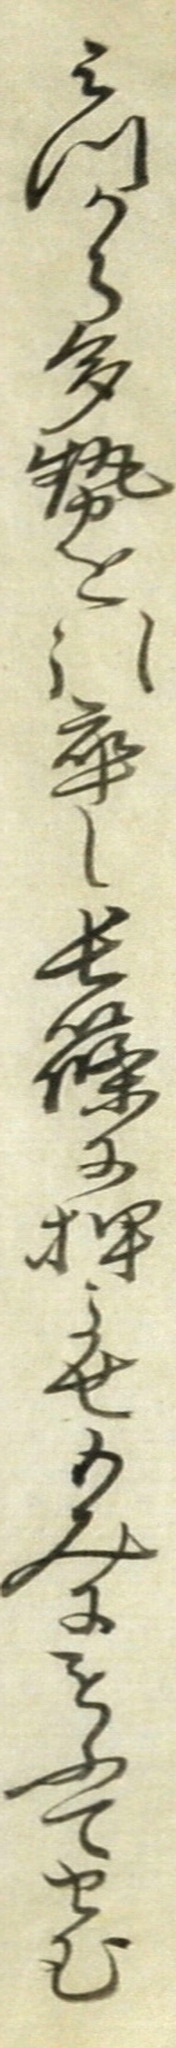みつから多勢を引率し長篠に押よせもみにをふてせむ
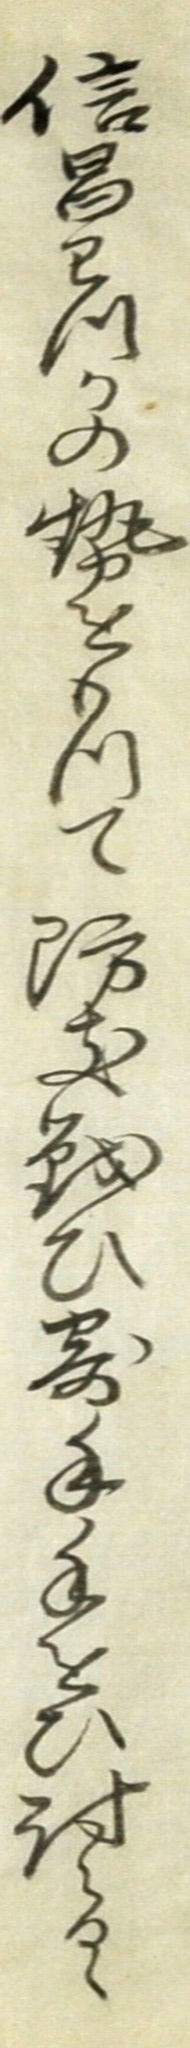信昌わつかの勢をもつて防き戦ひ寄手手をひ討らるゝ
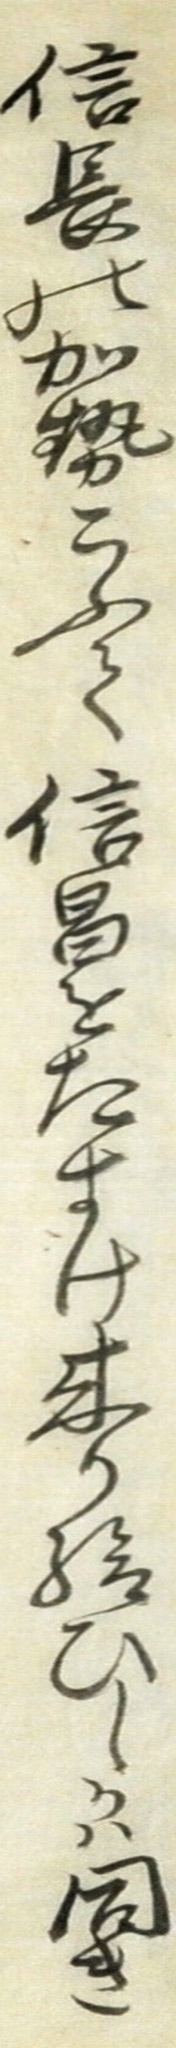信長の加勢こふて信昌をたすけ来り給ひしかは同き
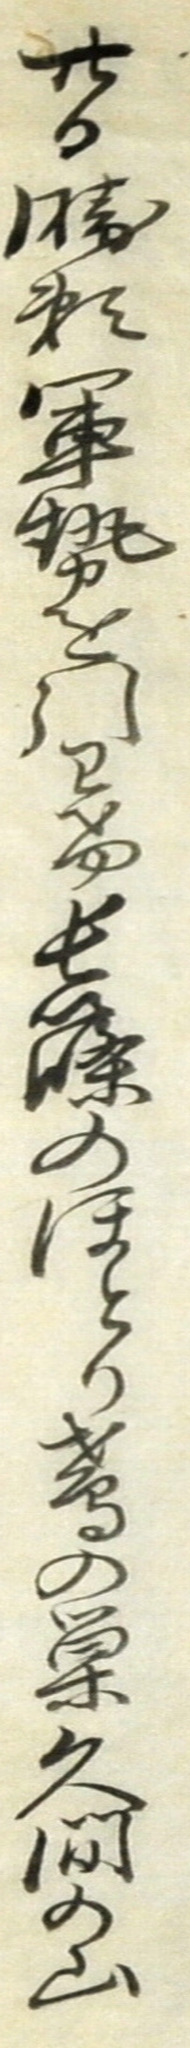廿日勝頼軍勢を引わけ長篠のほとり鳶の巣久間の山
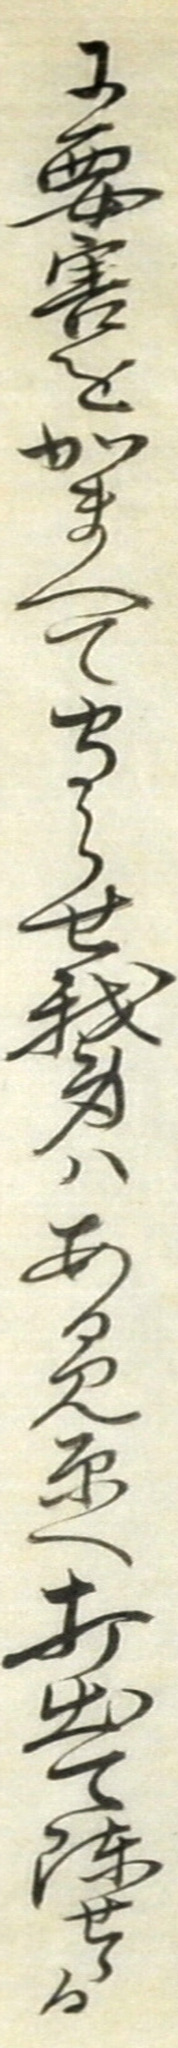に要害をかまへて守らせ我身はある見原へ打出て陣せらる
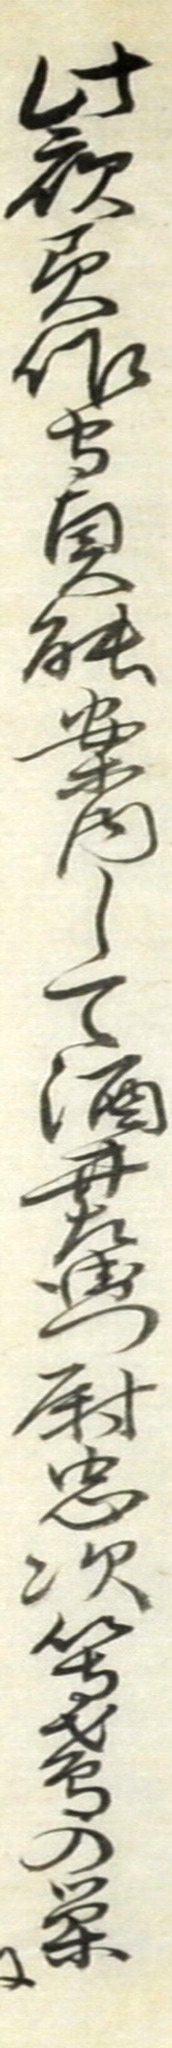此夜美作守貞能案内して酒井左衛門尉忠次等鳶の巣に
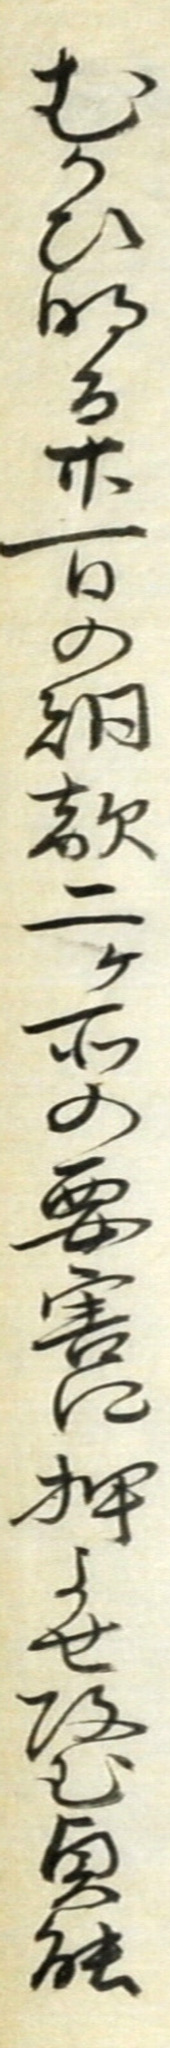むかひ明る廿一日の朝敵二ヶ所の要害に押よせ攻む貞能
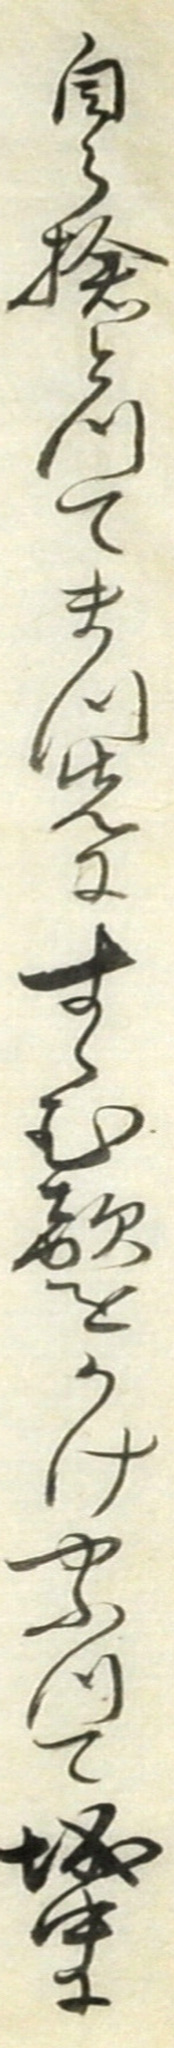自ら槍とつてまつ先にすゝむ敵をかけやふつて城中に
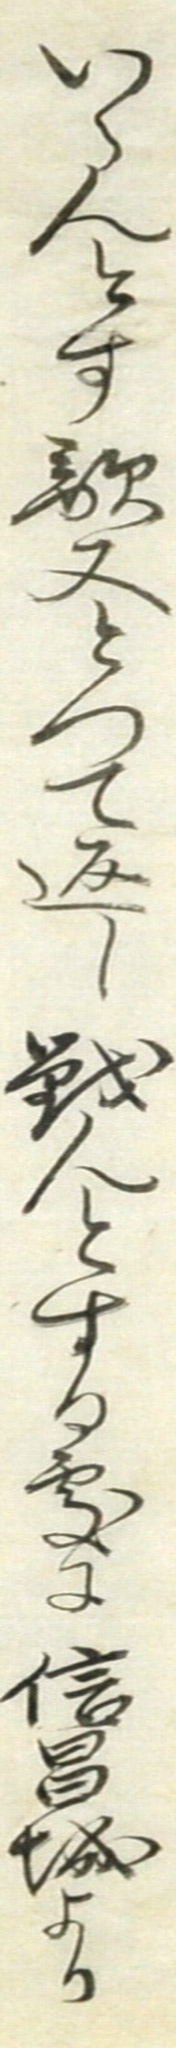いらんとす敵又とつて返し戦んとする処に信昌城より
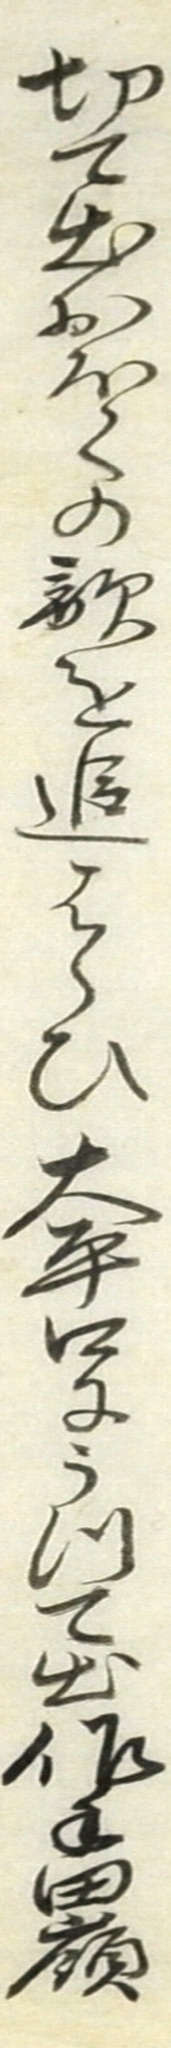切て出おほくの敵を追はらひ大平口にうつて出作手田嶺
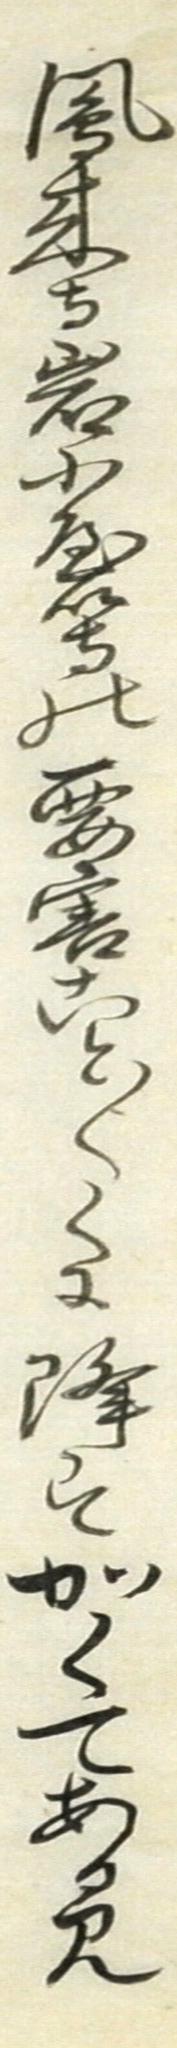鳳来寺岩小屋等の要害こと〳〵くに降すかくてある見
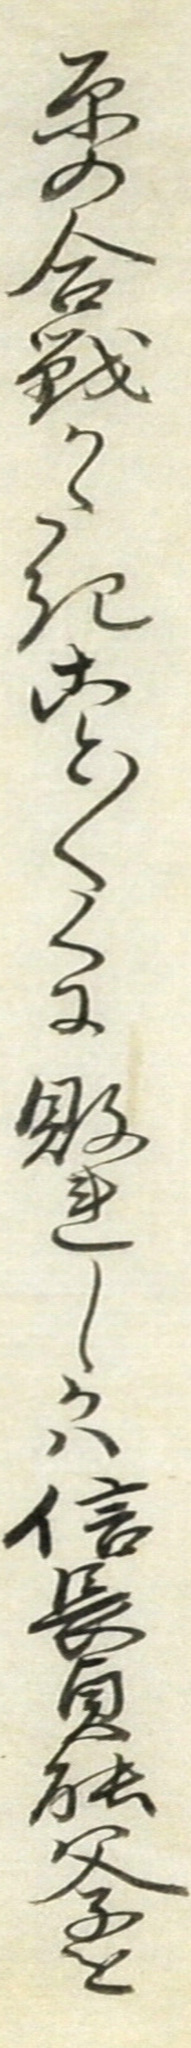原の合戦かたきこと〳〵くに敗れしかは信長貞能父子を
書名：藩翰譜（六）
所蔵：伊那市立高遠町図書館・合同会社AMANE
